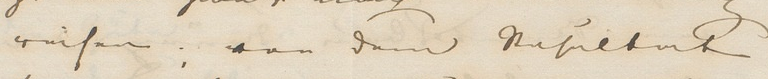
reisen; von dem Resultat
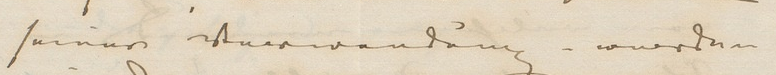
seiner Verwendung – werden
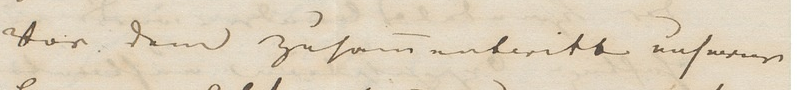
Vor dem Zusammentritt unserer
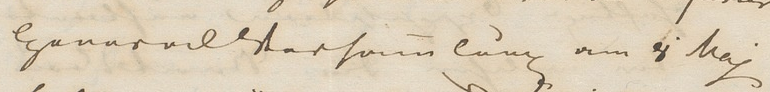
GeneralVersammlung am 8t Maj
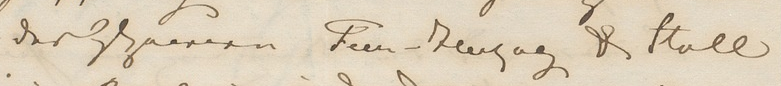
der Herrn Feer-Herzog & Stoll
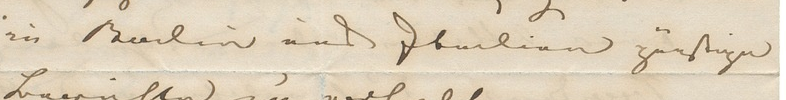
in Berlin und Italien günstige
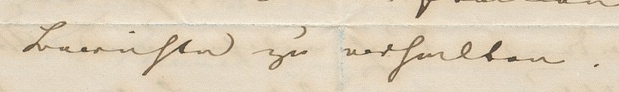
Berichte zu erhalten.
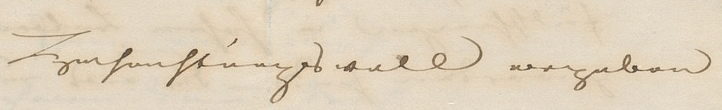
Hochachtungsvoll ergeben
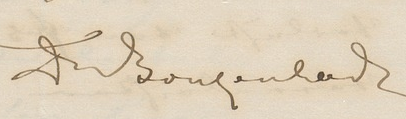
Dr Gonzenbach.
